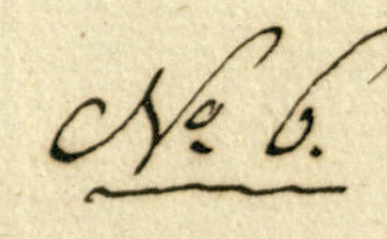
No 6.
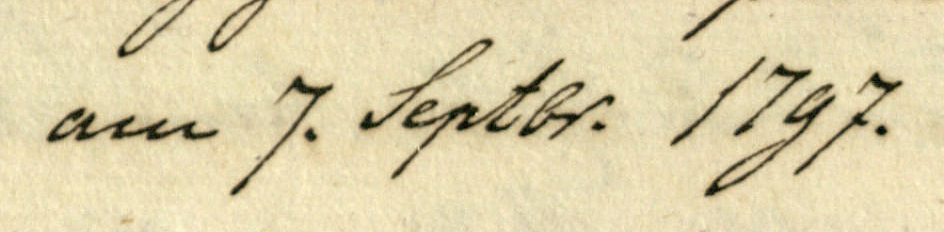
am 7. Septbr. 1797.
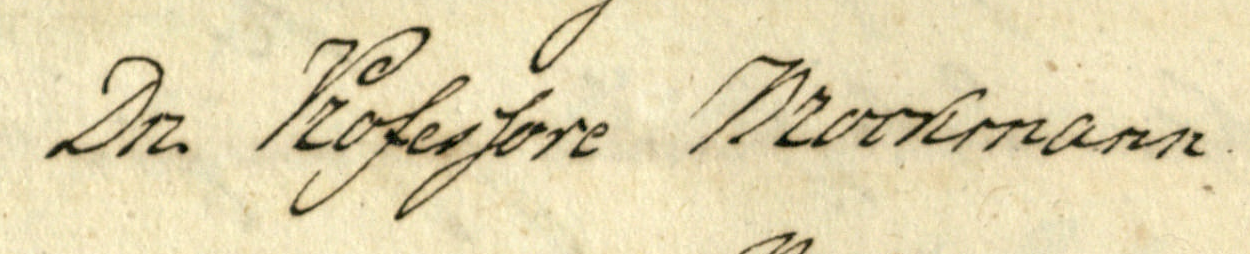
Dn. Professor Brockmann
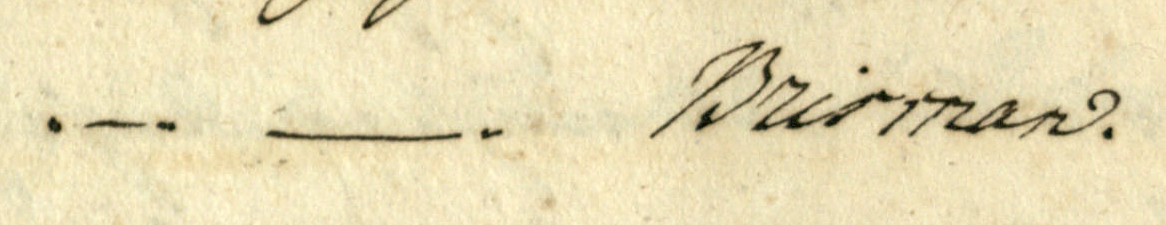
" Brisman.
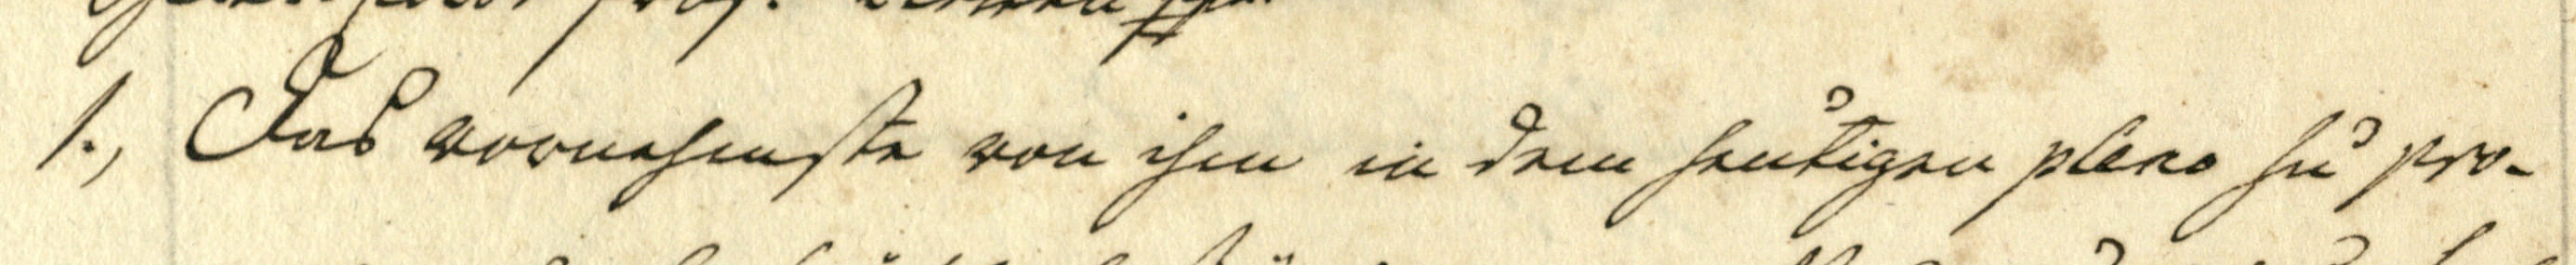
1., Das vornehmste von ihm in dem heutigen pleno zu pro¬
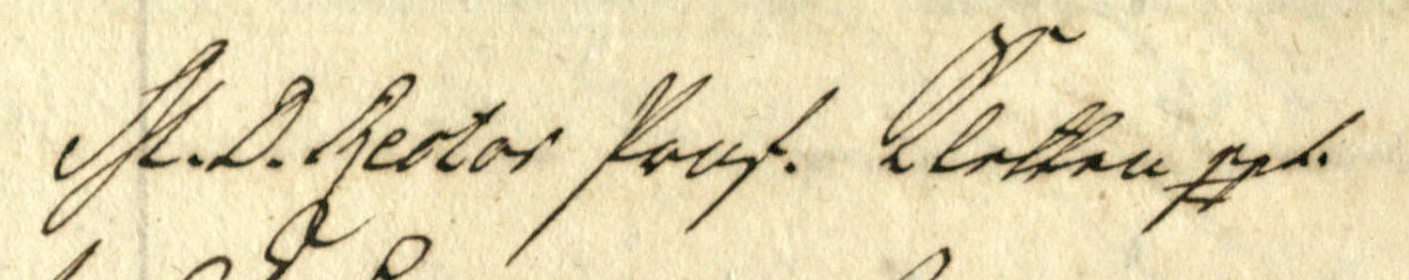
dh. Rector Prof. Kletten ppt
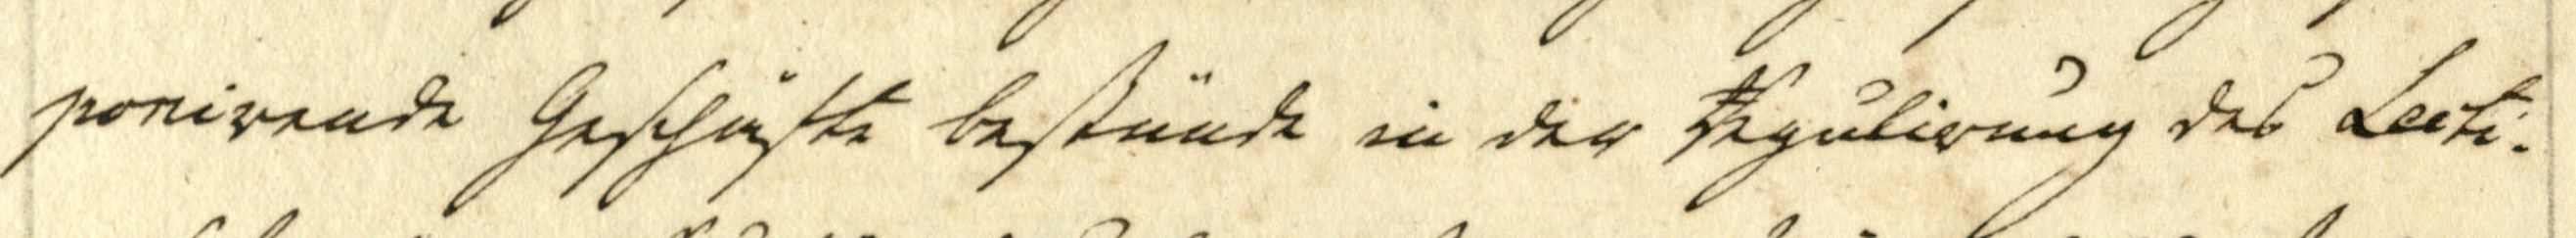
ponirende Geschäfte bestünde in der Regulirung des Lecti¬
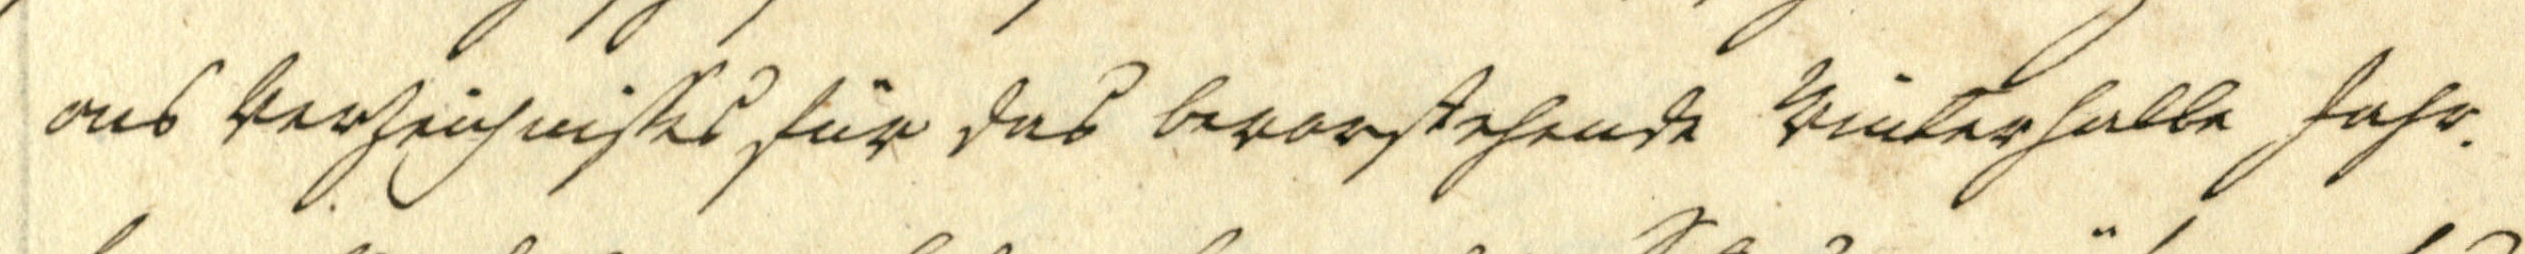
ons Verzeichnisses für das bevorstehende Winterhalbe Jahr.
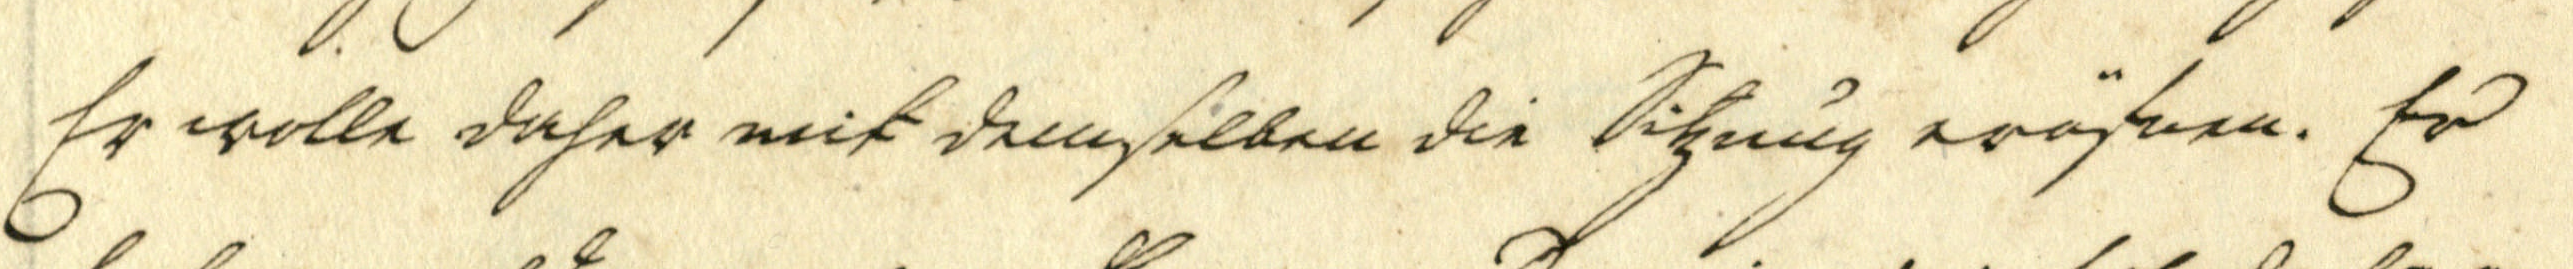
Er wolle daher mit demselben die Sitzung eröfnen. Er
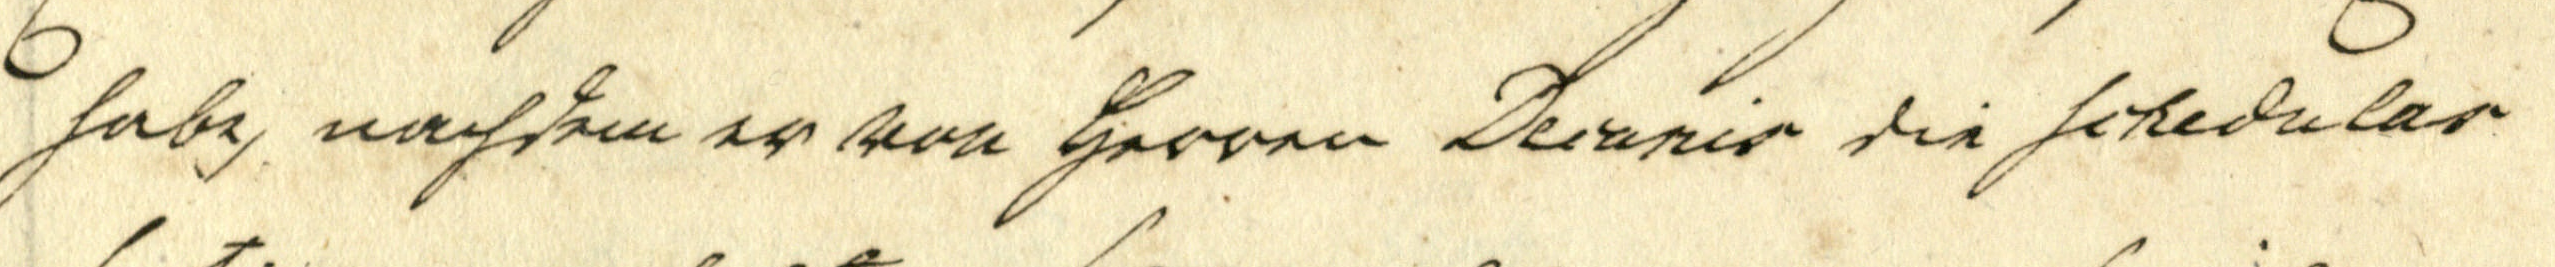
habe, nachdem er von Herren Decanis die Schedulas
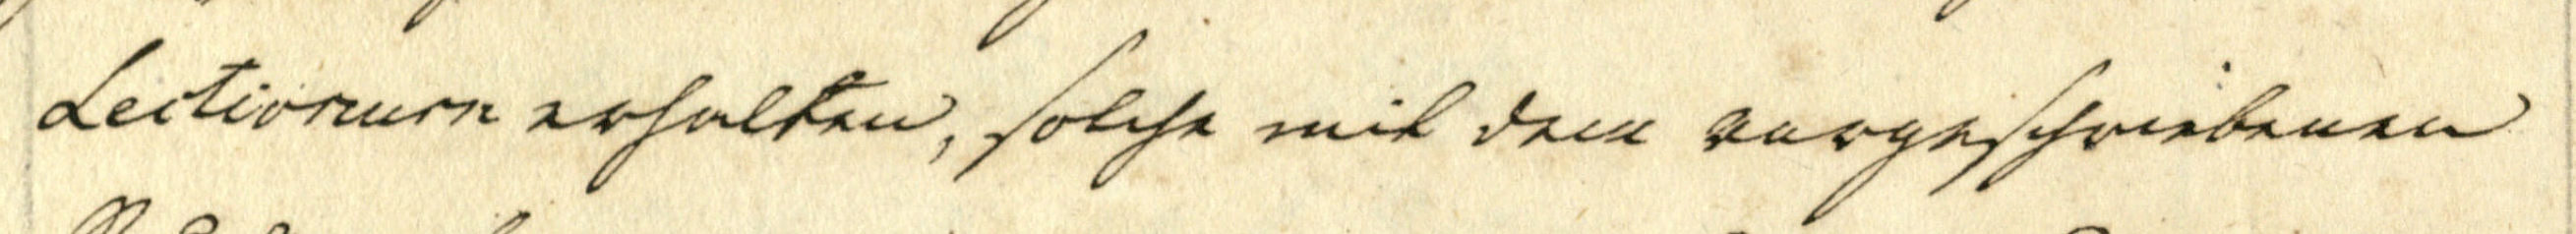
Lectionum erhalten, solche mit dem vorgeschriebenen
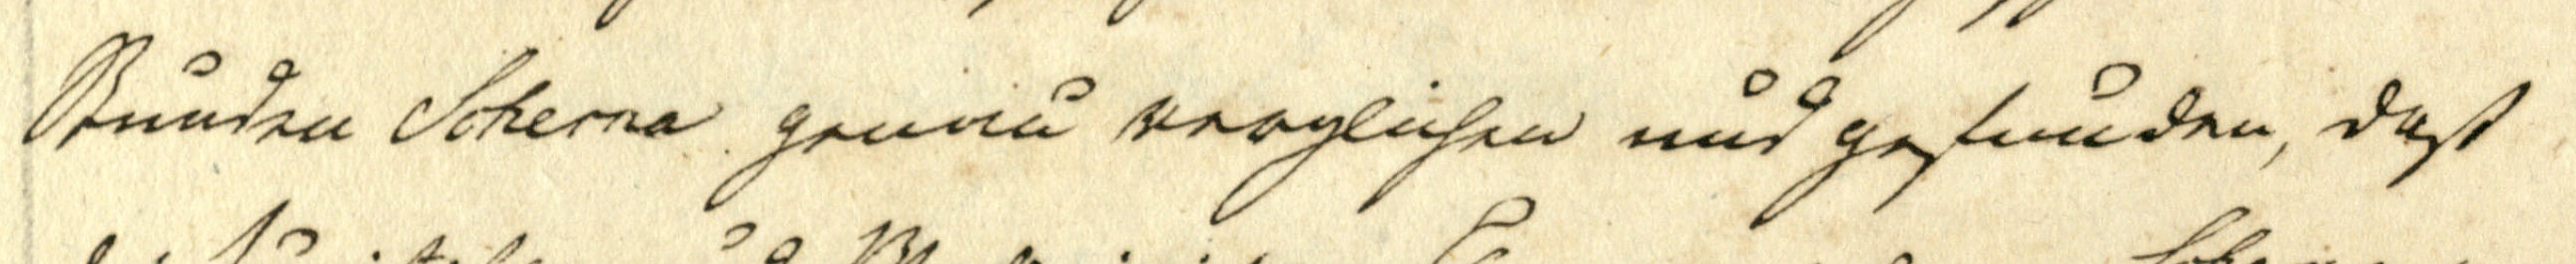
Stunden Schema genau verglichen und gefunden, daß
